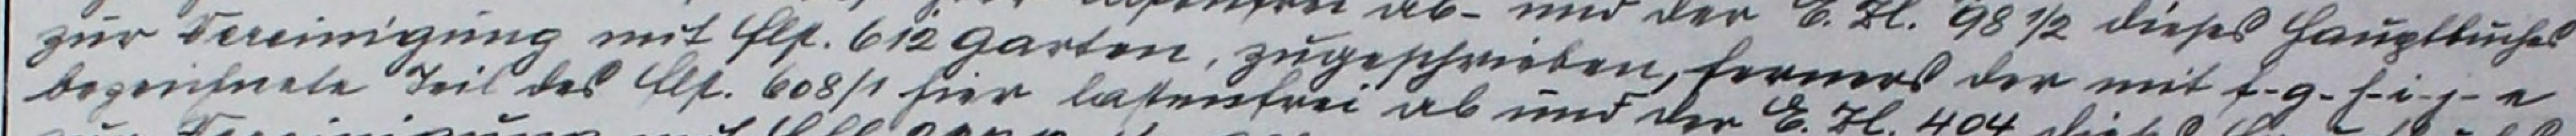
zur Vereinigung mit Fl?. 612 Garten, zugeschrieben, Ferners der mit f - g - h - i - j - n
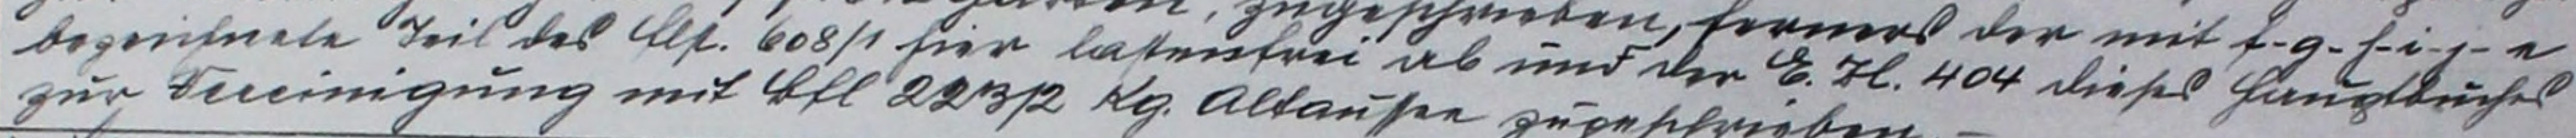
bezeichnete Teil des Fl?. 608/1 hier lastenfrei ab und der E. Zl. 404 dieses Hauptbuches
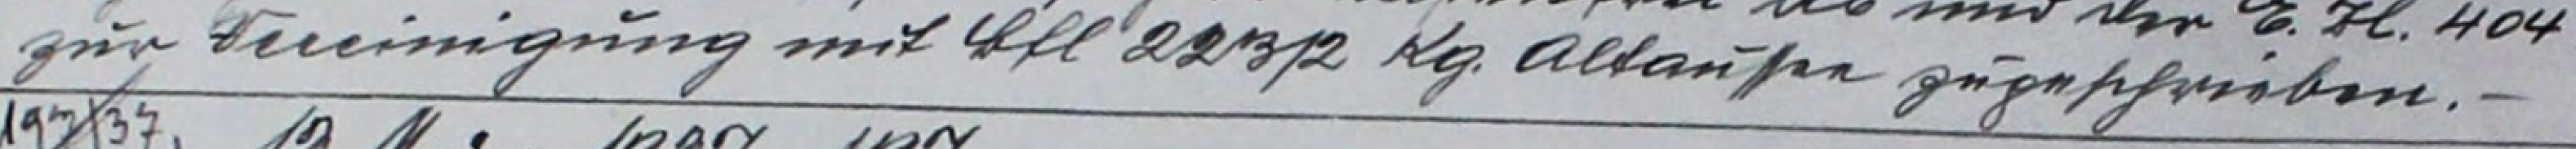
zur Vereinigung mit Bfl 223/2 Kg. Altaussee zugeschrieben.
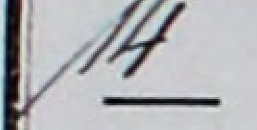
14
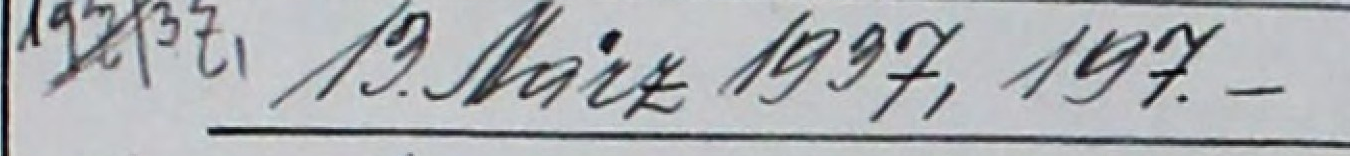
197/37, 13. März 1937, 197. -
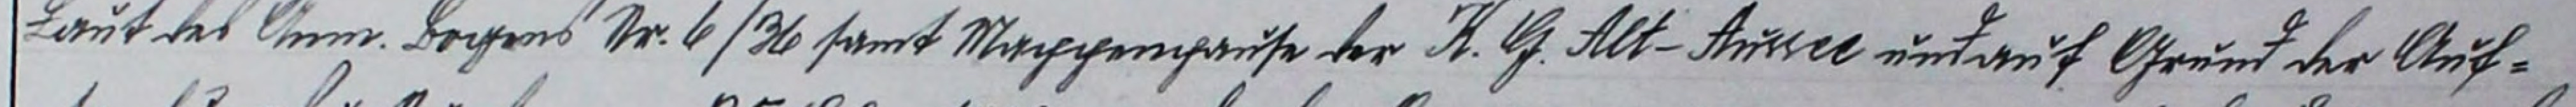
Laut des Anm. Borgens Nr. 6/63 samt Machchenchause der K.H. Alt-Aussee und auf Grund der Auf=
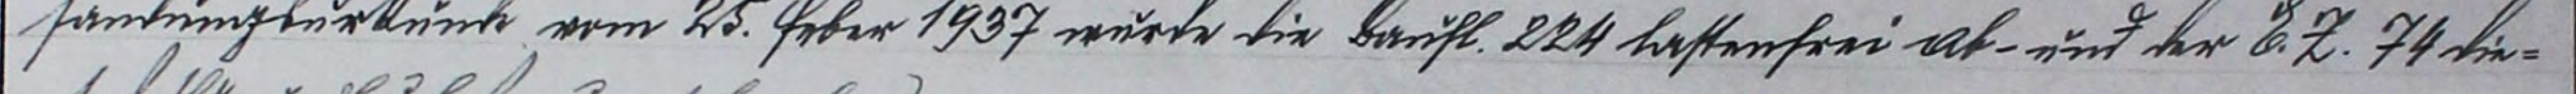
sandungburkunde vom 25 Feber 1937 wurde die Baufl. 224 lastenfrei ab- und der E.Z. 74 die=
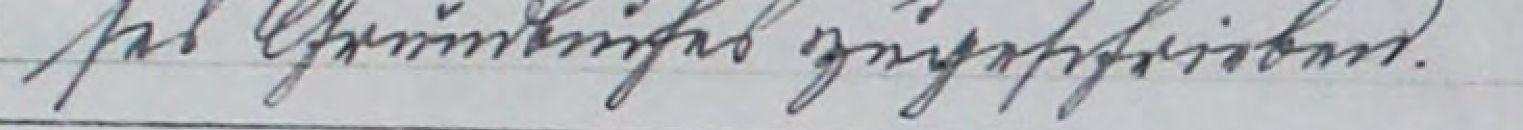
ses Grundbuches zugeschrieben.
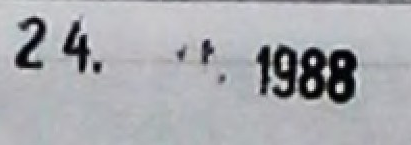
24. ??? 1988
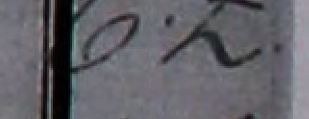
? Z.
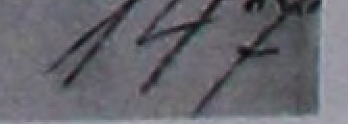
147
